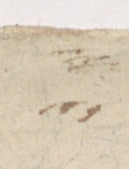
153.
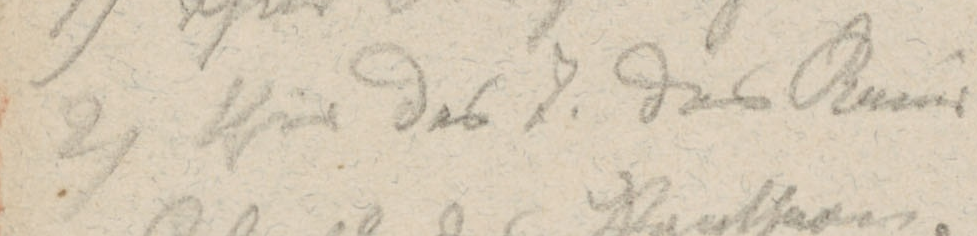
nicht mehr genau erkennen lassen,
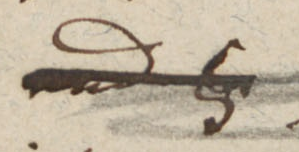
erhaltenen
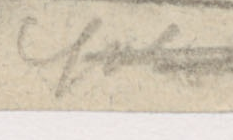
berühmte
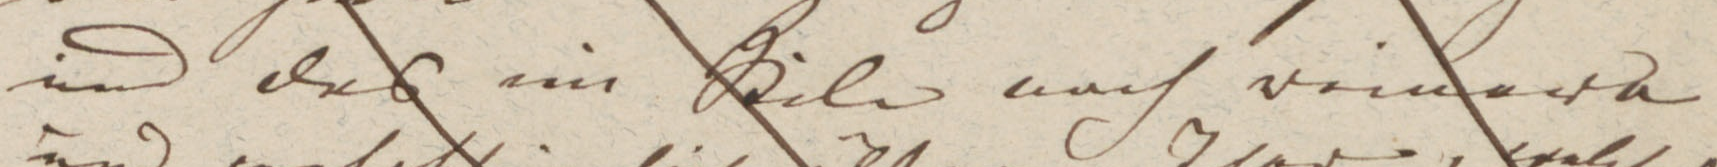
und das im Stile noch reinere
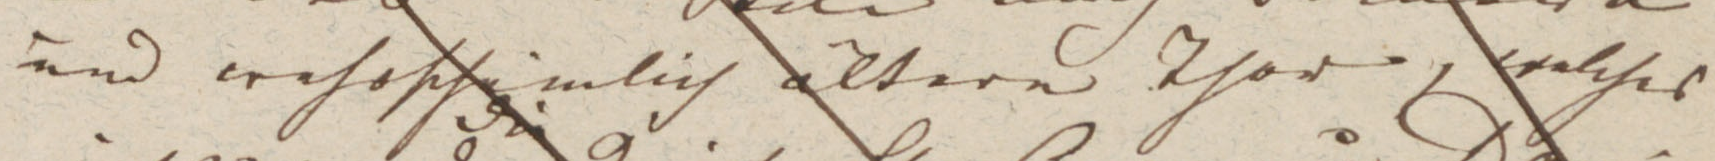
und wahrscheinlich ältere Thor, welches
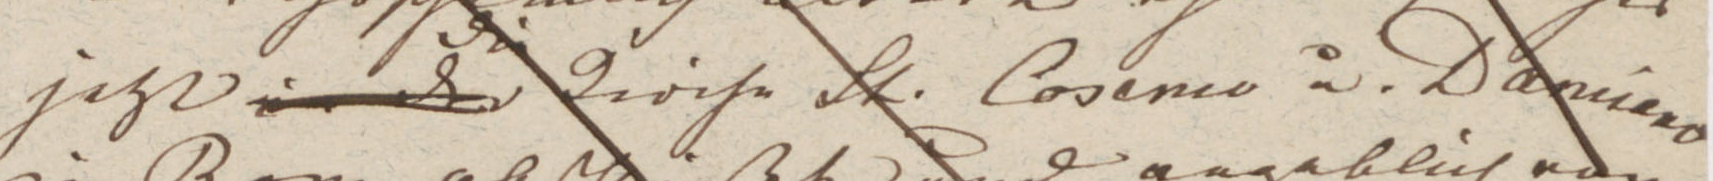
jetzt in der die Kirche St. Cosemo u. Damiano
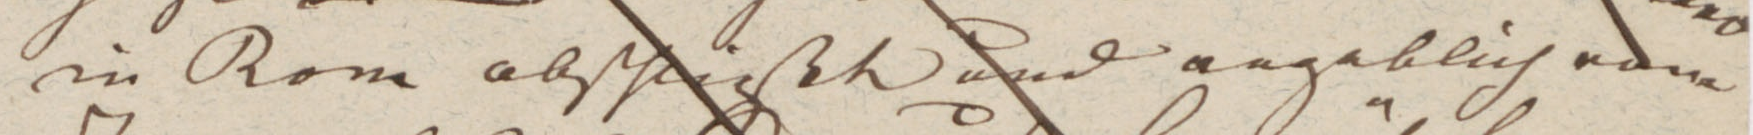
in Rom abschliesst und angeblich vom
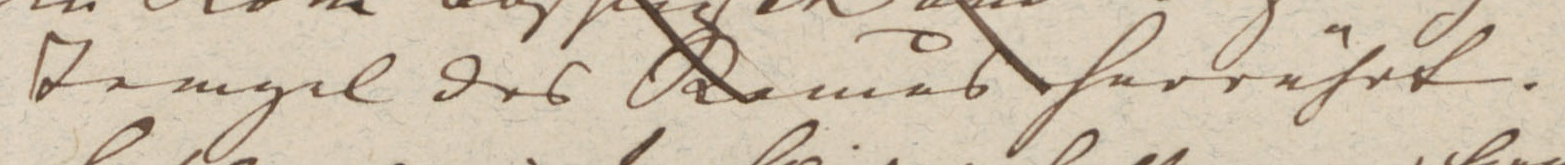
Tempel des Remus herrührt.
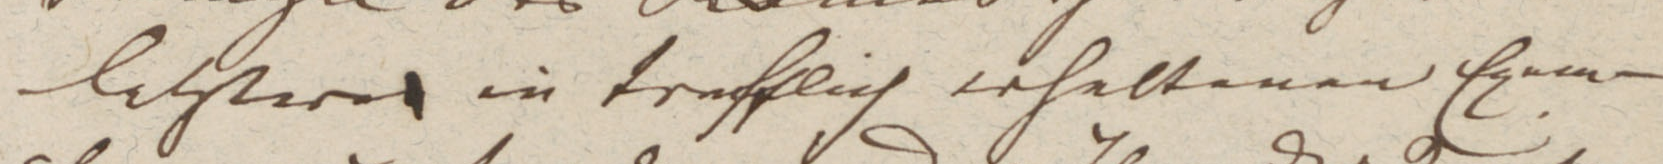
letzterer in trefflich erhaltenen Exem-
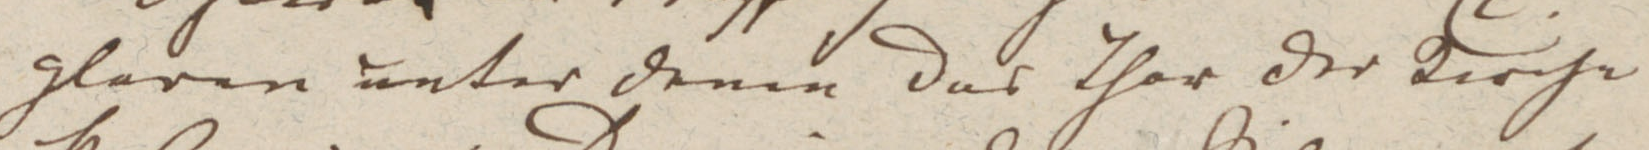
plaren unter denen das Thor der Kirche
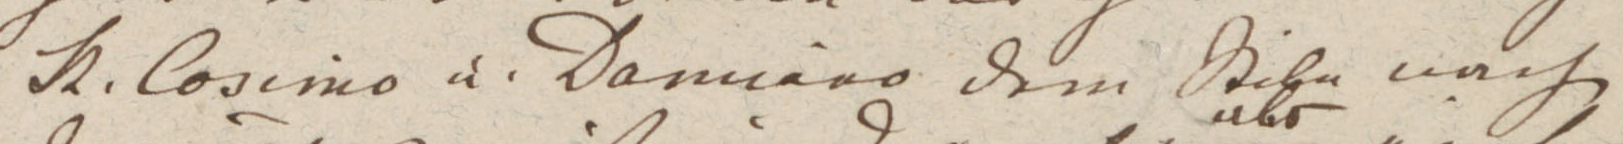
St. Cosimo u. Damiano dem Stile nach
